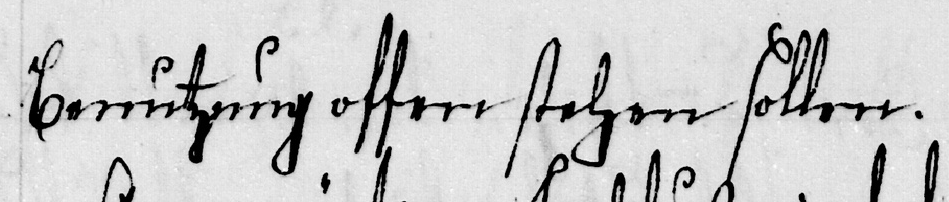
Benutzung offen stehen sollen.
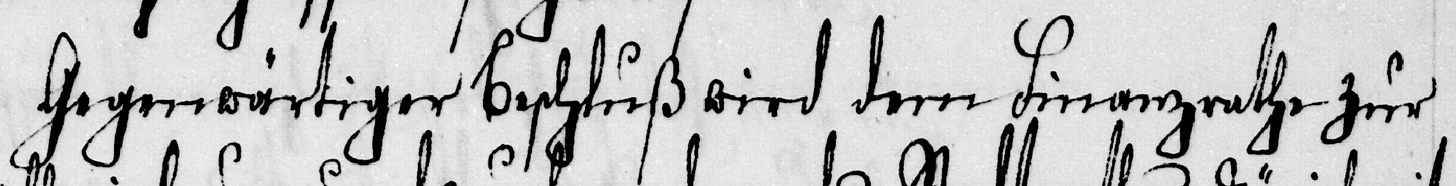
Gegenwärtiger Beschluß wird dem Finanzrathe zur
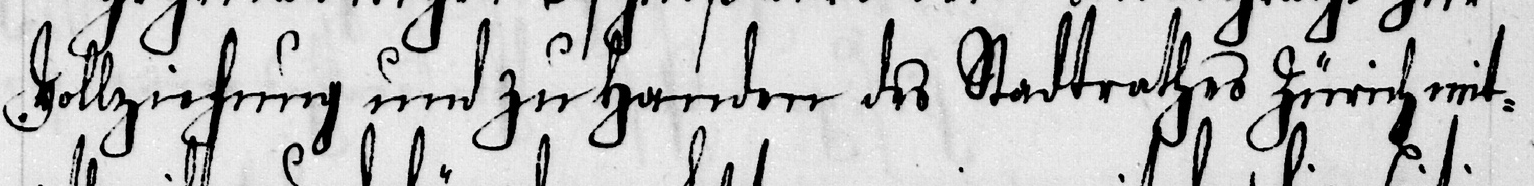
Vollziehung und zu Handen des Stadtrathes Zürich mit¬
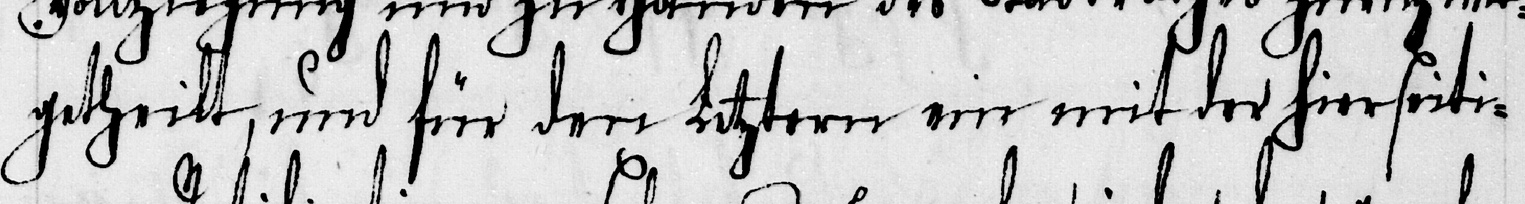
getheilt, und für den Letztern ein mit der hierseiti¬
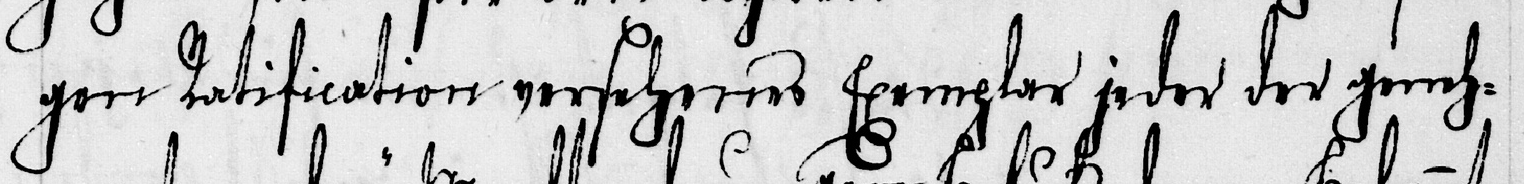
gen Ratification versehenes Exemplar jeder der geneh¬
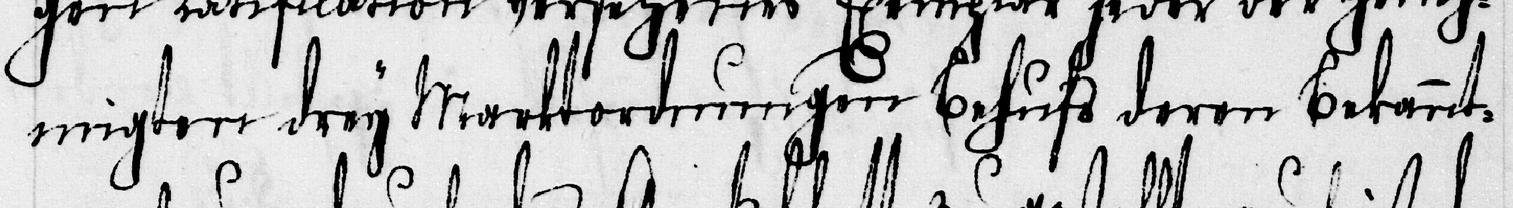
migten drey Marktordnungen Behufs deren Bekannt¬
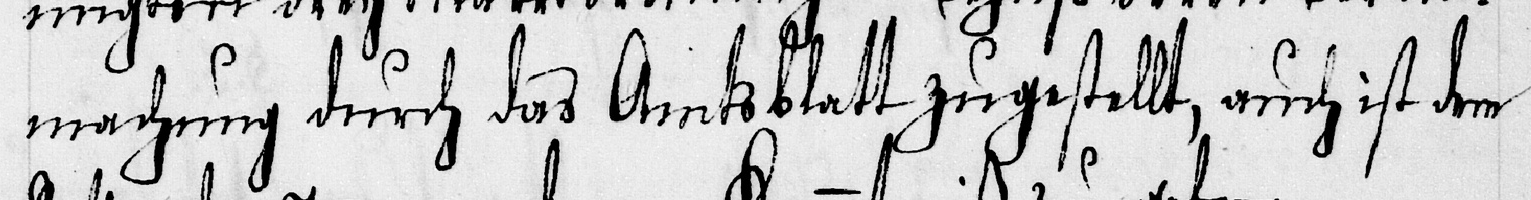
machung durch das Amtsblatt zugestellt, auch ist dem
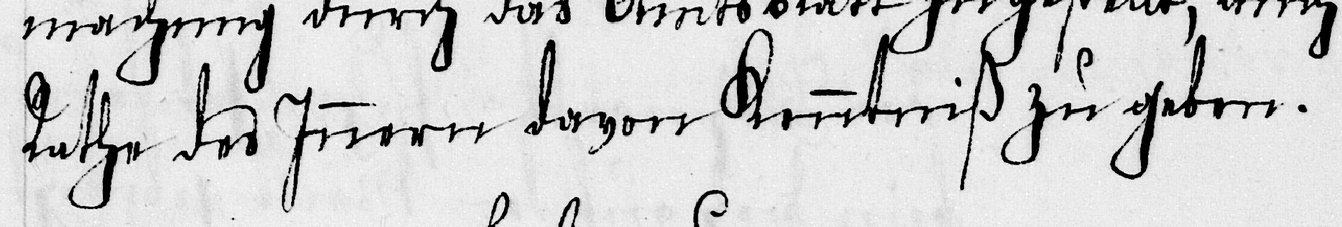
Rathe des Innern davon Kenntniß zu geben.
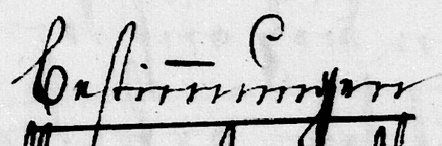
Bestimmungen
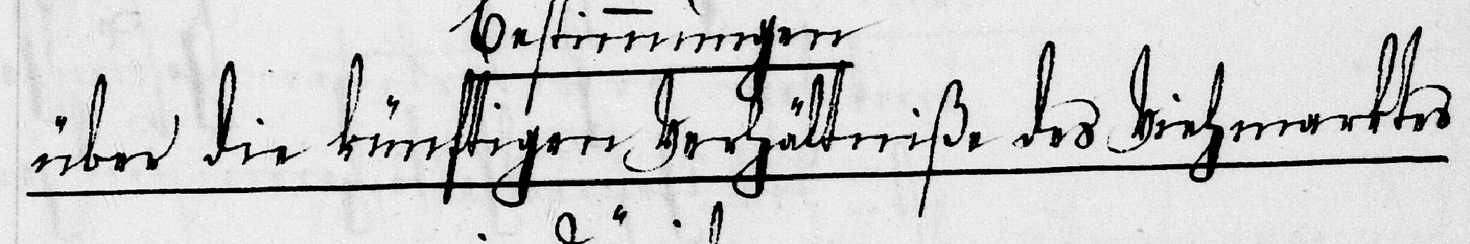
über die künftigen Verhältniße des Viehmarktes
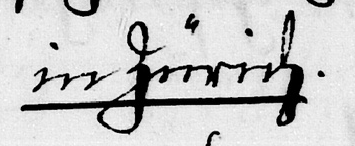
in Zürich.
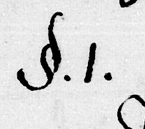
. .
